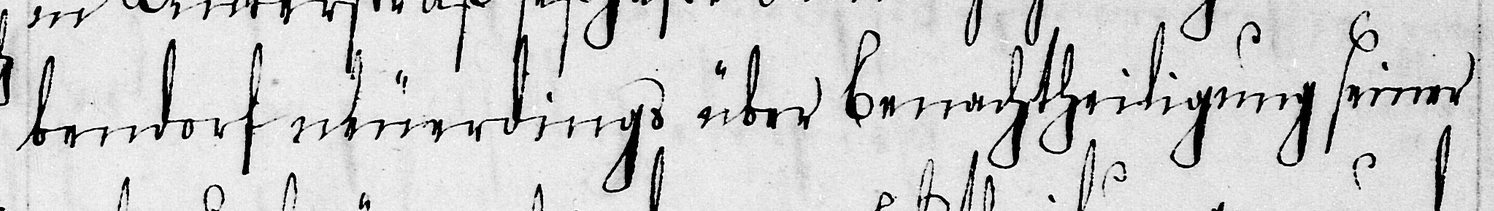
bendorf neuerdings über Benachtheiligung seiner
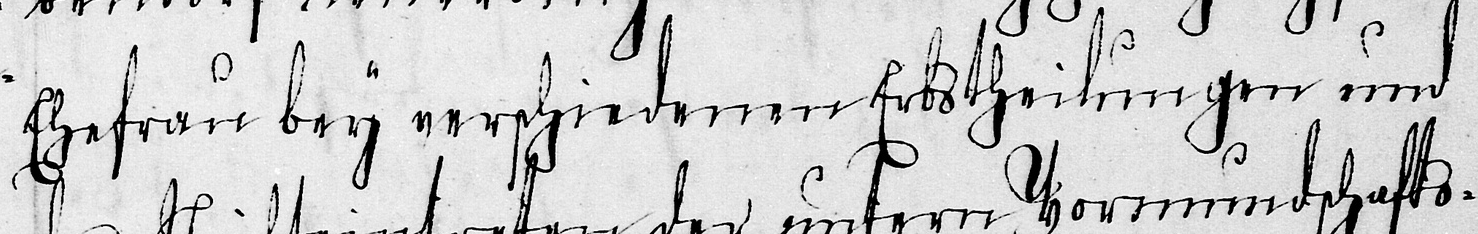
Ehefrau bey verschiedenen Erbstheilungen und
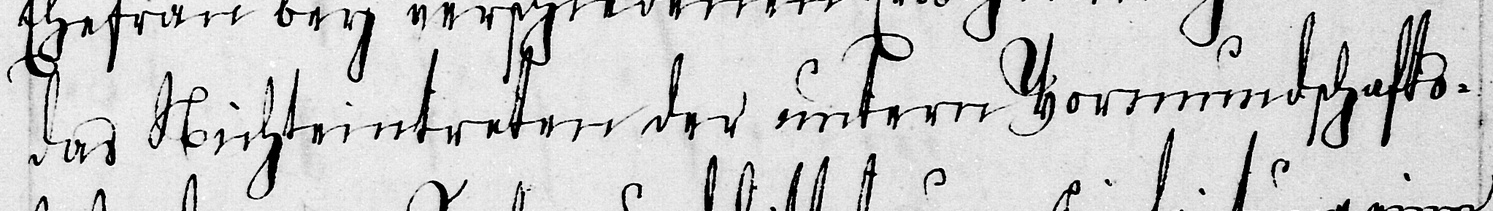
das Nichteintreten der untern Vormundschafts¬
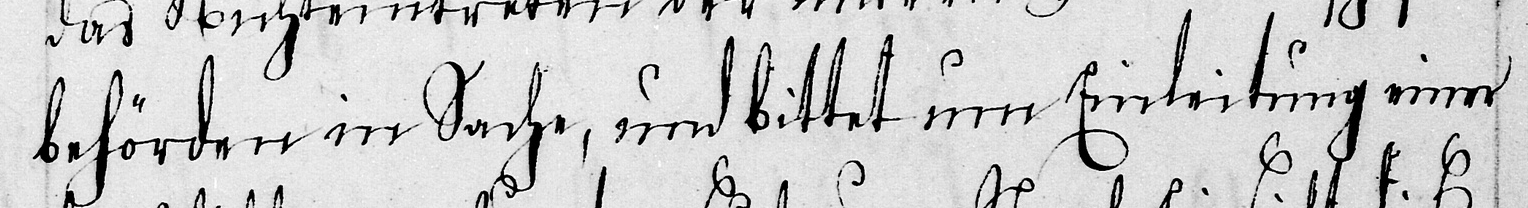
behörden in Sache, und bittet um Einleitung einer
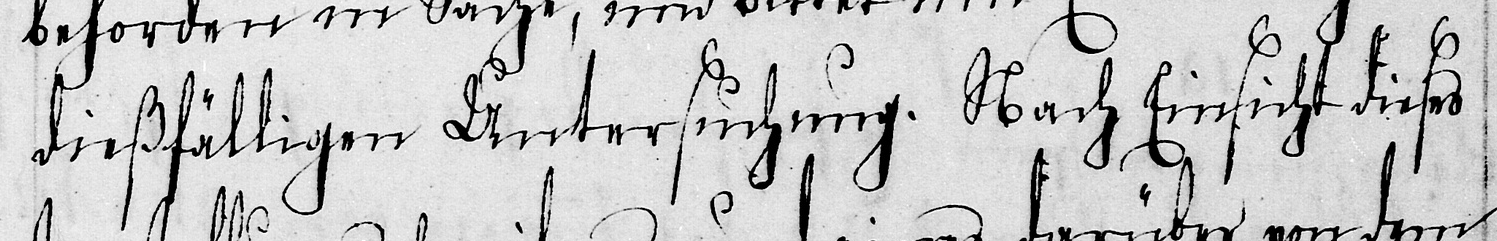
dießfälligen Untersuchung. Nach Einsicht dieses
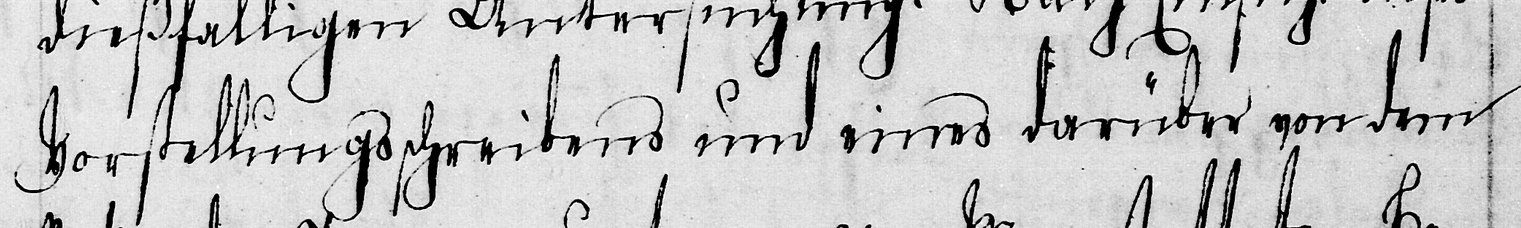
Vorstellungsschreibens und eines darüber von dem
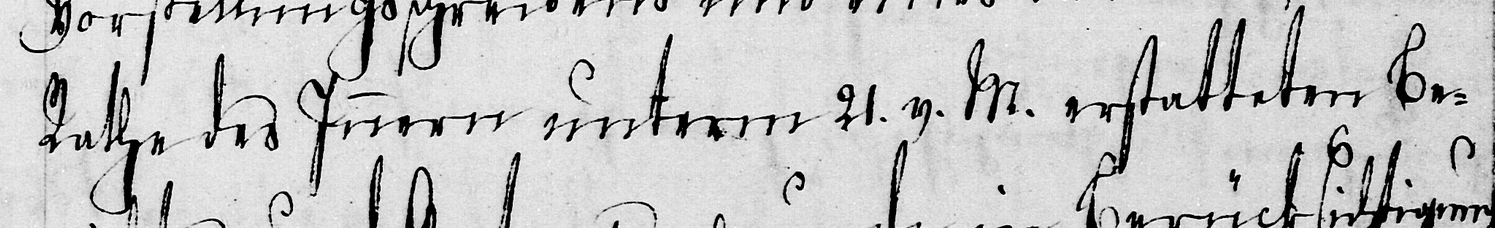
Rathe des Innern unterm 21. v. M. erstatteten Be¬
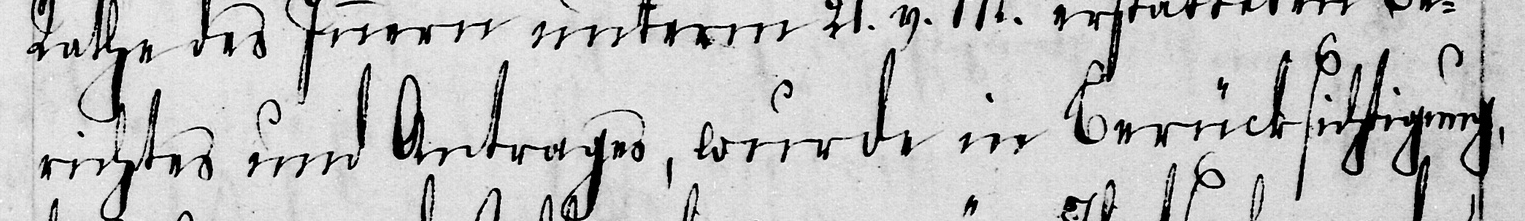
richtes und Antrages, wurde in Berücksichtigung,
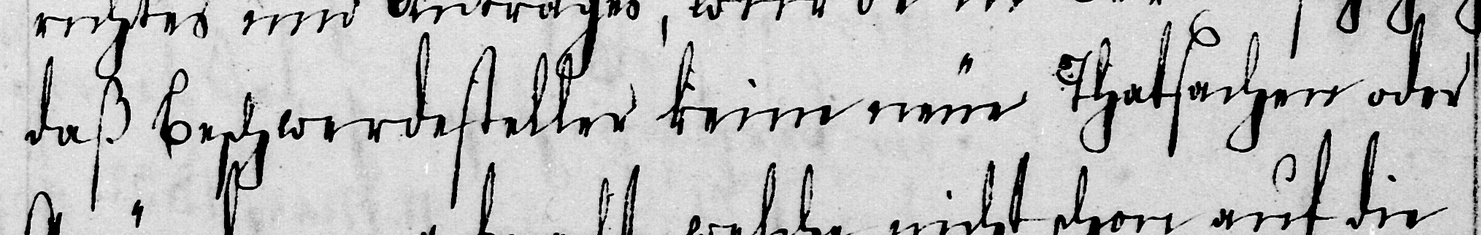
daß Beschwerdesteller keine neue Thatsachen oder
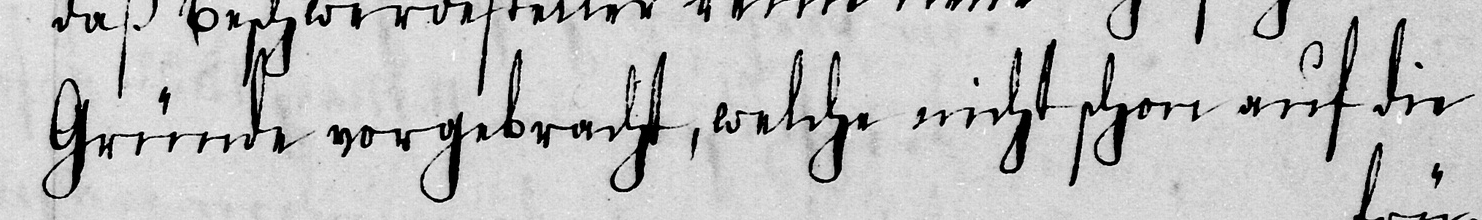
Gründe vorgebracht, welche nicht schon auf die
